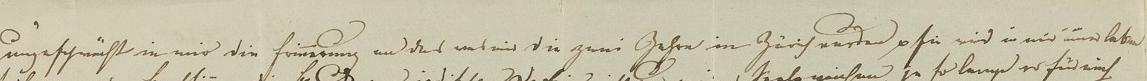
ungeschwächt in mir die Erinnerung an das was mir die zwei Jahre in Zürich wurden & sie wird in mir immer leben
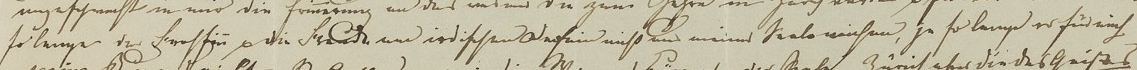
so lange der Frohsinn & die Freude am irdischen Dasein nicht aus meiner Seele weichen, ja so lange es für mich
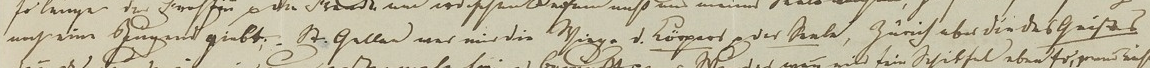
noch eine Jugend giebt; – St. Gallen war mir die Wiege d. Körpers & der Seele, Zürich aber die des Geistes
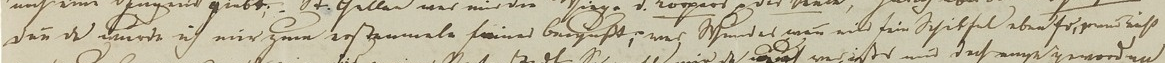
denn da wurde ich mir zum erstenmale seiner bewußt; was Wunder wenn mir sein Schiksal ebenso, wenn nicht
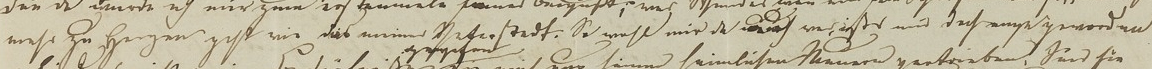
mehr zu Herzen geht wie das meiner Vaterstadt. So wohl mir da auch war, ists mir doch enge geworden
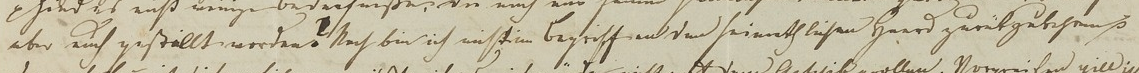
aber auch gestillt worden? Noch bin ich nicht im Begriff an den heimathlichen Heerd zurükzukehren &
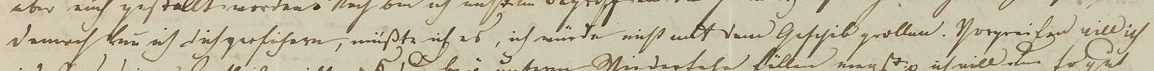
dennoch kann ich dich versichern, müßte ich es, ich würde nicht mit dem Geschik grollen. Vorgreifen will ich
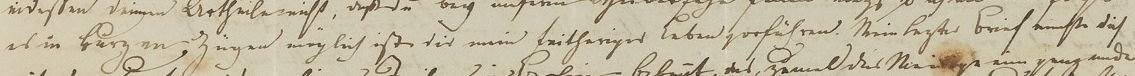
es in kurzen Zügen möglich ist dir mein seitheriges Leben vorführen. Mein lezter Brief machte dich
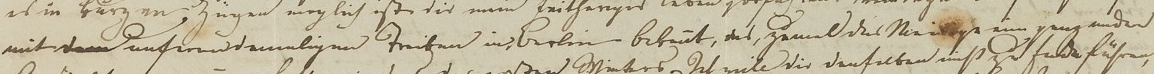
mit dem unserm damaligen Treiben in Berlin bekannt, das, zumal das Meinige eine ganz andere
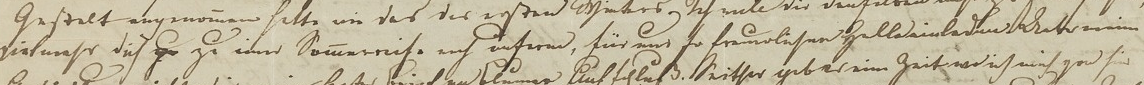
vielmehr dich zu einer Sommerreise nach unserm, für uns so freundlichen Halle einladen. Ueber meine
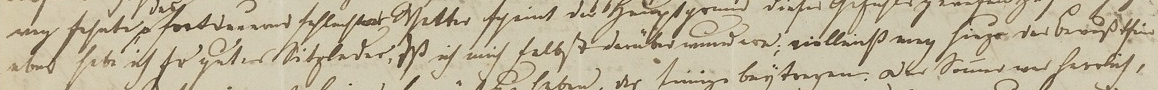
aber habe ich so gutes Sitzleder, dß ich mich selbst darüber wundere; vielleicht mag hiezu das Bewußtsein
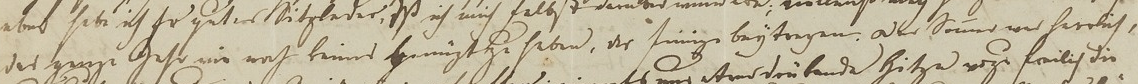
das ganze Jahr wie noch keines genützt zu haben, das seinige beytragen. Der Sommer war herrlich,
